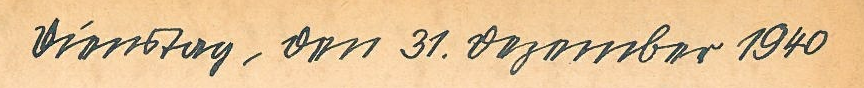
Dienstag, den 31. Dezember 1940
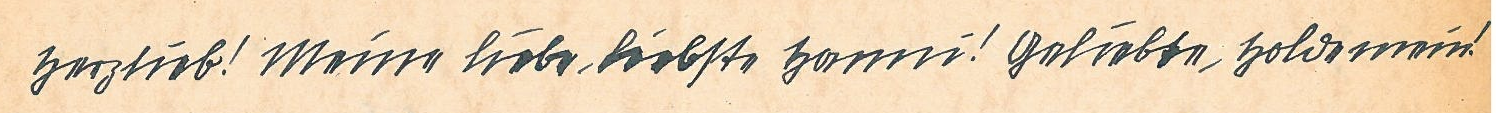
Herzlieb! Meine liebe, liebe Geliebte, Holde mein!
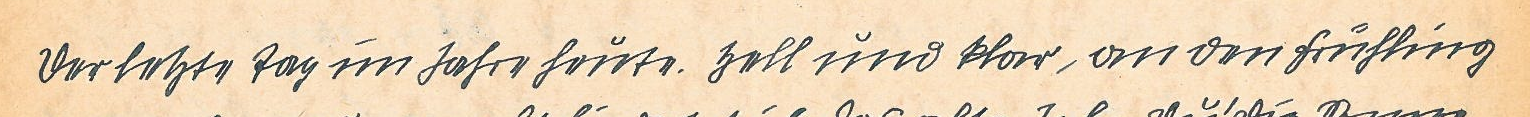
Der letzte Tag im Jahr heute. Hell und klar, an den Frühling
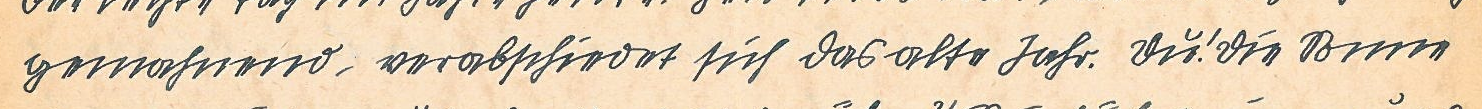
gemahnend, verabschiedet sich das alte Jahr. Du! Die Sonne
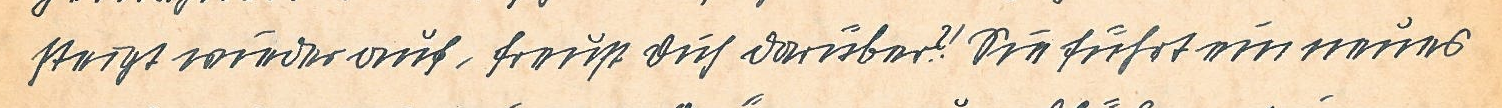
steigt wieder auf, freust Dich darüber?! Sie führt ein neues
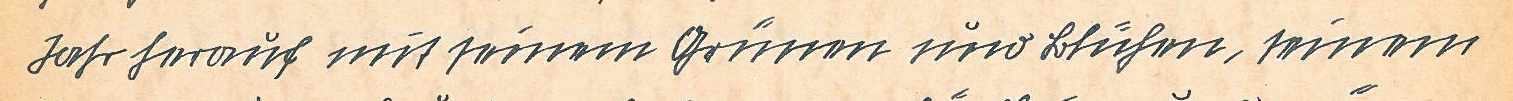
Jahr herauf mit seinem Grünen und Blühen, seinem
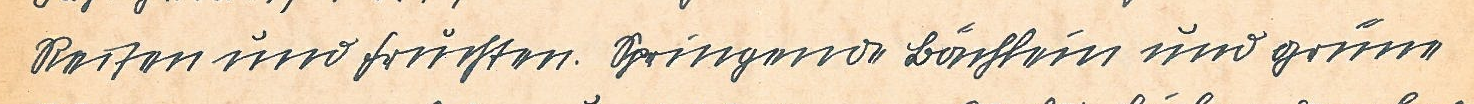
Reifen und Fruchten. Springende Bächlein und grüne
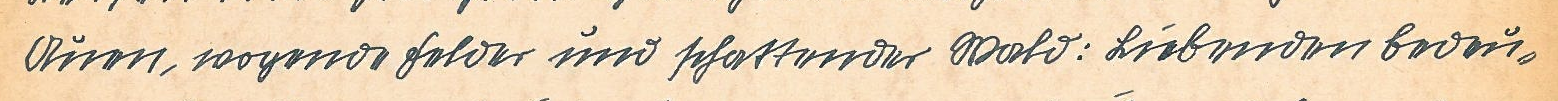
Auen, wogende Felder und schattender Wald: Liebenden bedeu¬
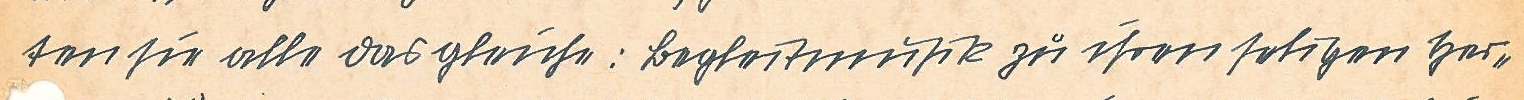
ten sie allen das gleiche: Begleitmusik zu ihren seligen Her¬
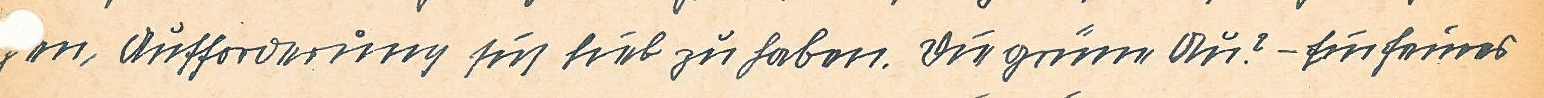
en, Aufforderung sich lieb zu haben. Die grüne Au? — Ein feines
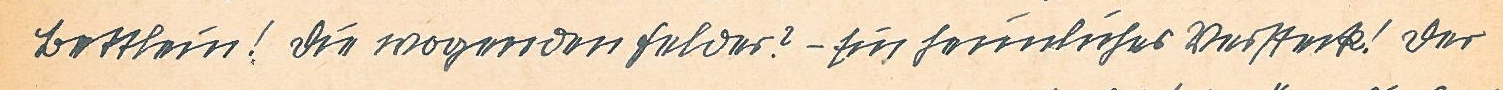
Bettlein! Die wogenden Felder ? — Ein heimliches Versteck! Der
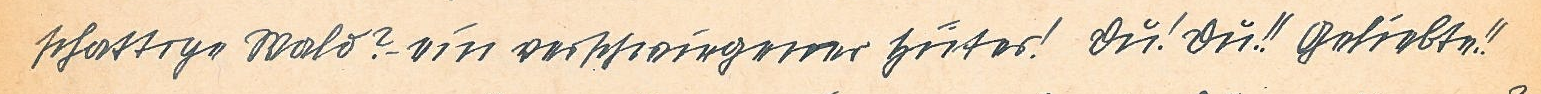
schattige Wald? — ein verschwiegener Hüter! Du! Du!! Geliebte!!
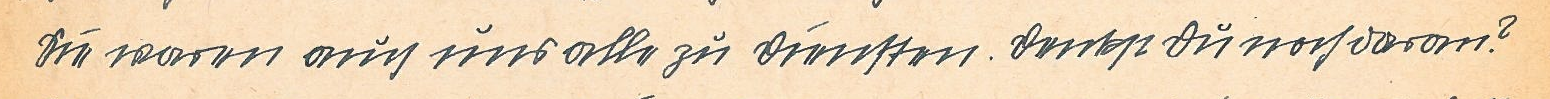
Die waren auch uns alle zu Diensten. Denkst Du noch daran?
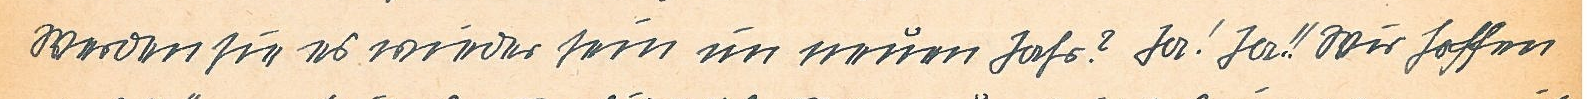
Werden sie es wieder sein im neuen Jahr? Ja! Ja!! Wir hoffen
